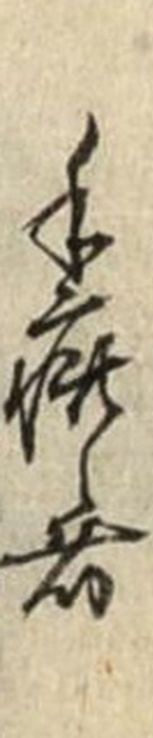手疵之者
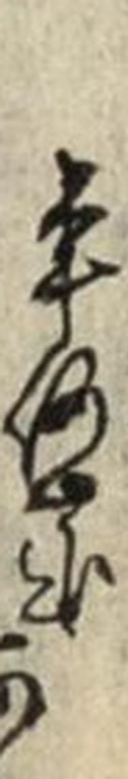年何歳
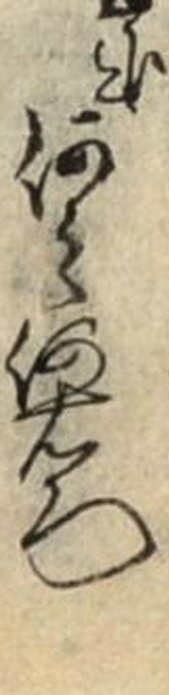何之何右衛門
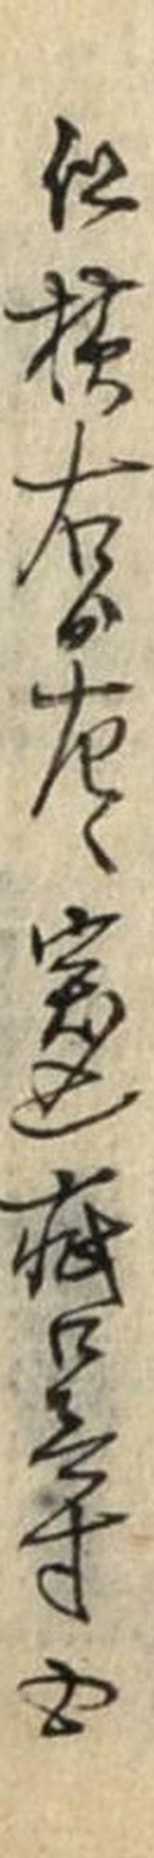但横右ゟ左へ突込疵口壱寸五
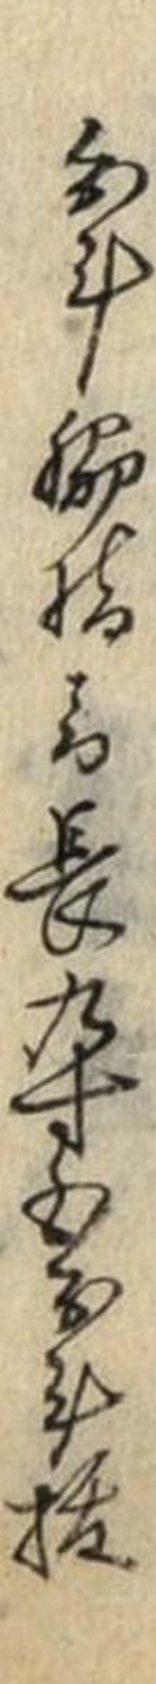分斗脇指にて長九寸五分斗抜
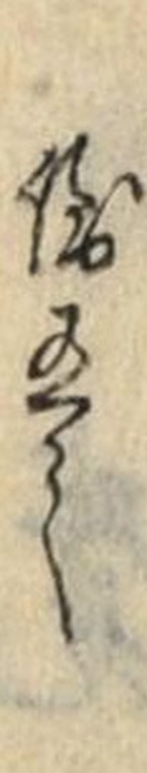倒有之

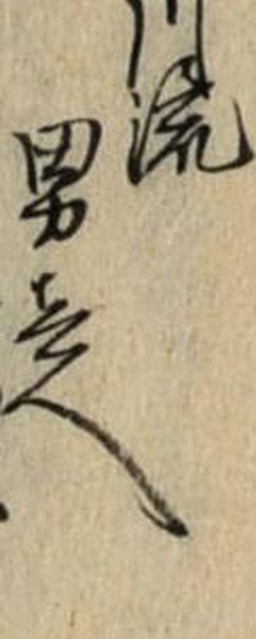男壱人
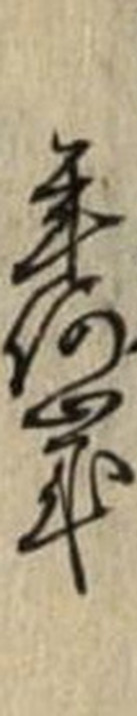年何歳
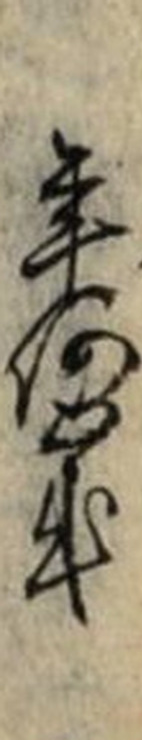年何歳
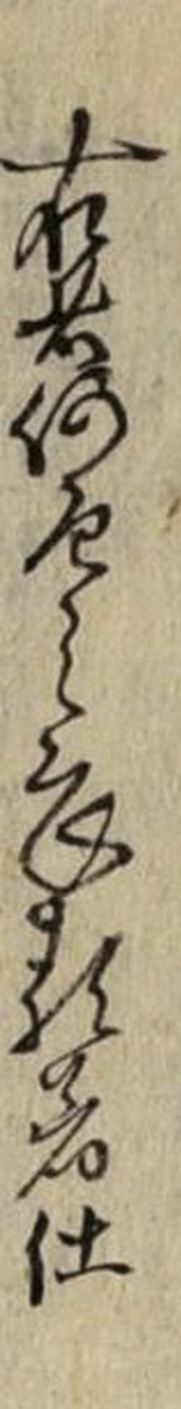右者何色之衣類着仕
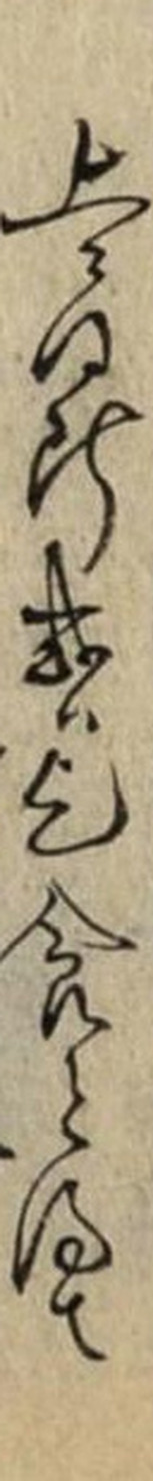上に同断或は乞食に候得は
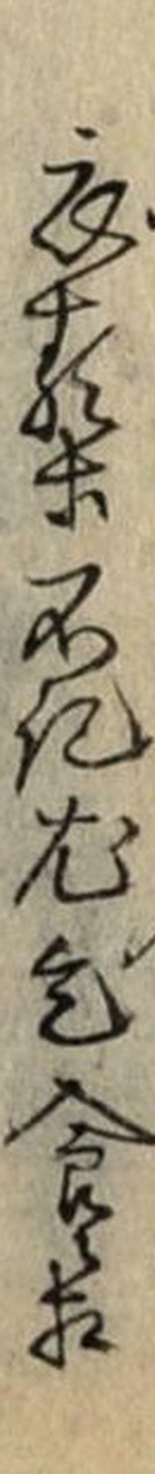衣類等不記尤乞食に相
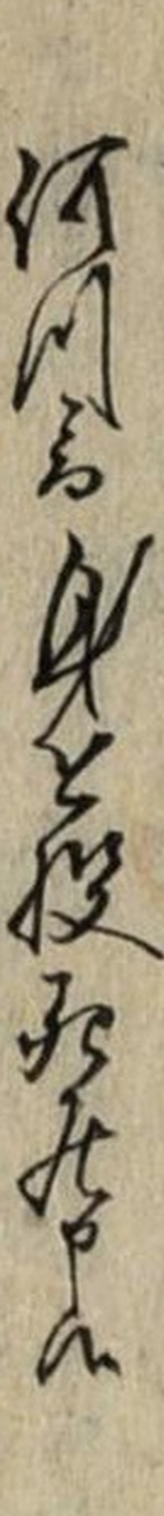何川にて身を投死居申候
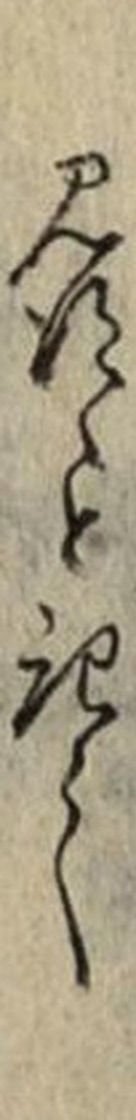見得候と記之
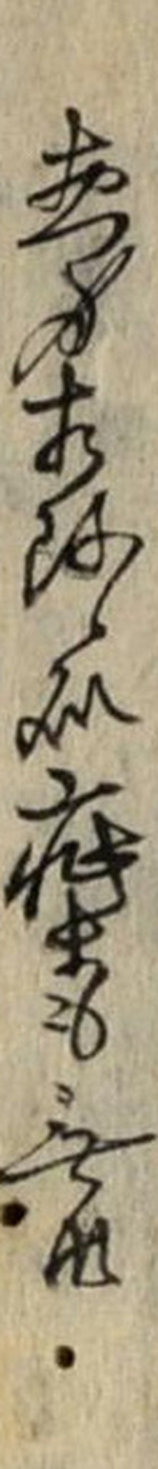惣身相改候処疵等も無御
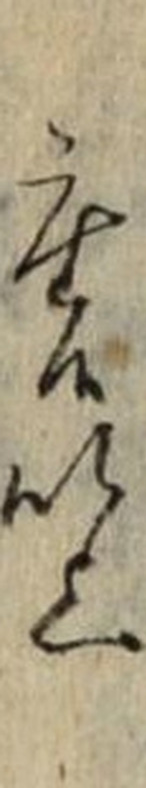座候以上
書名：御停止異変死失
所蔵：福井県文書館 Fukui Prefectural Archives
